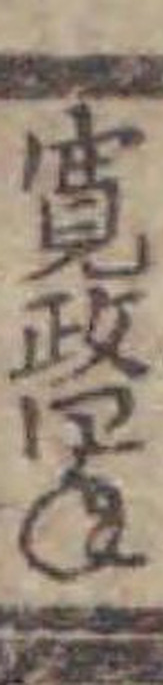寛政四年
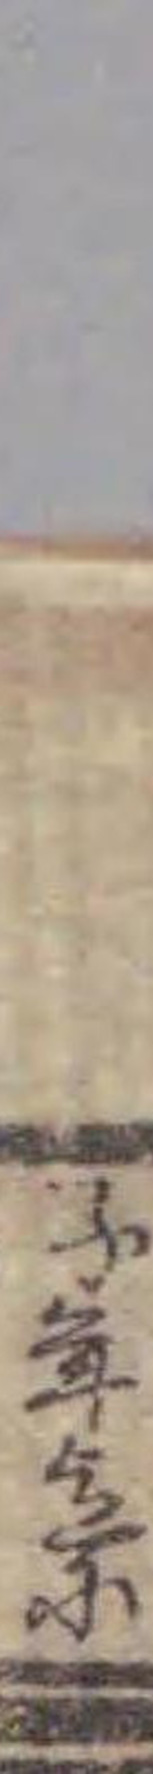子年迄に
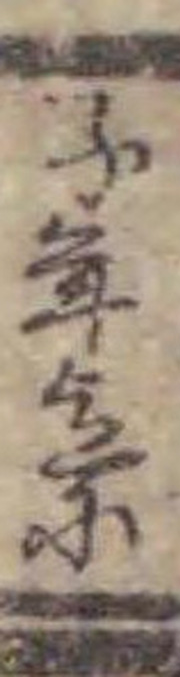子年迄に
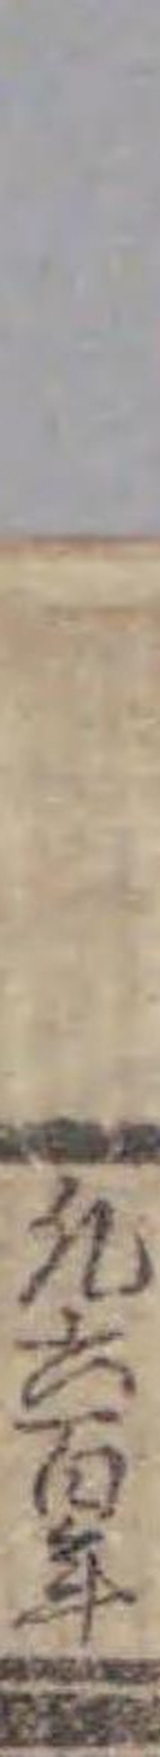凡六百年
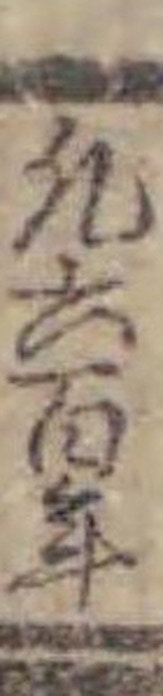凡六百年
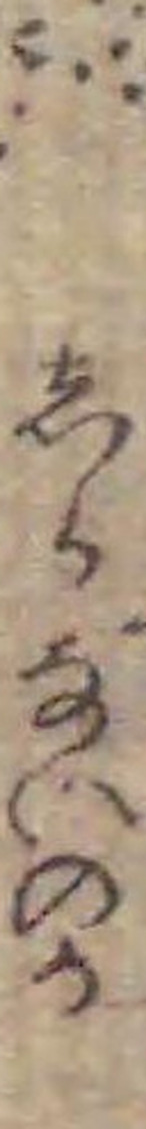しらないのか
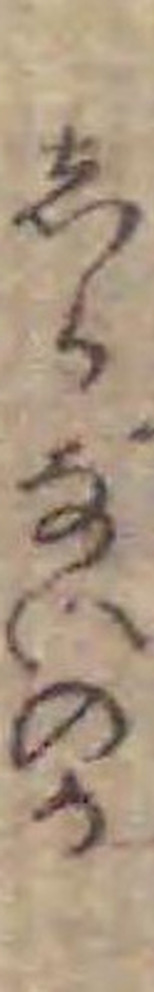しらないのか
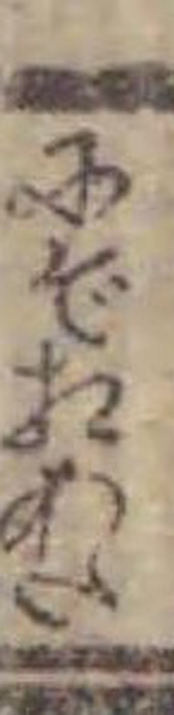にぞ相あた
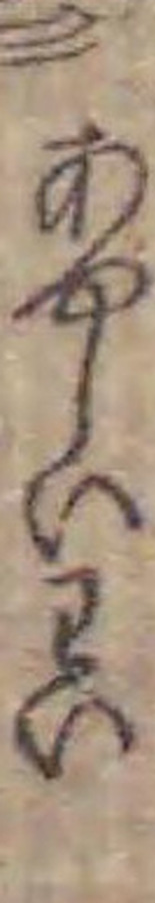あやしいわい
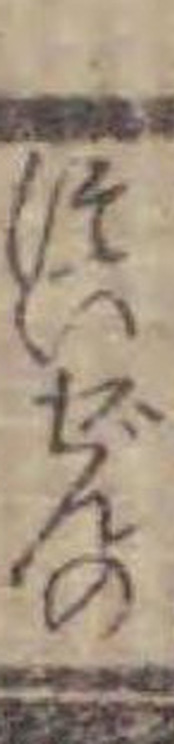ついぜんの
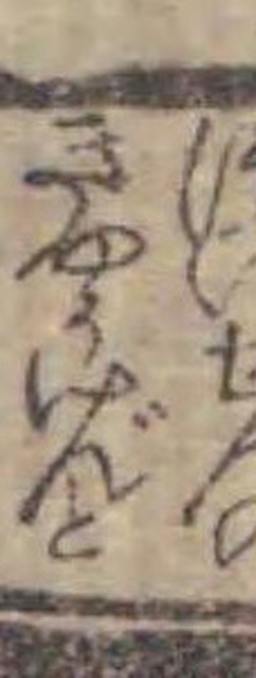きやうげんと
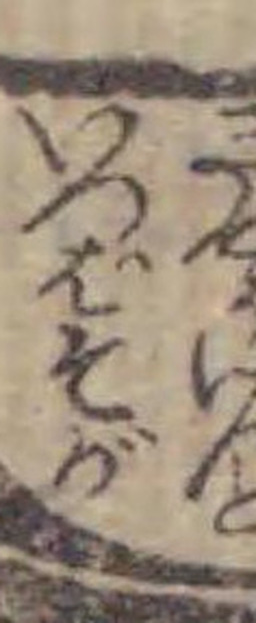いつぱそが
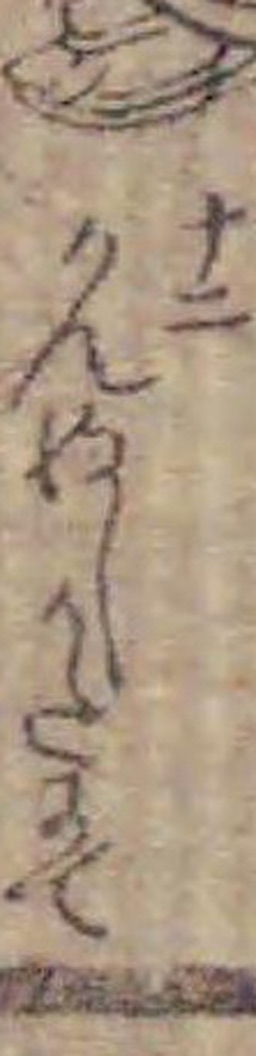かんぬしかたにて
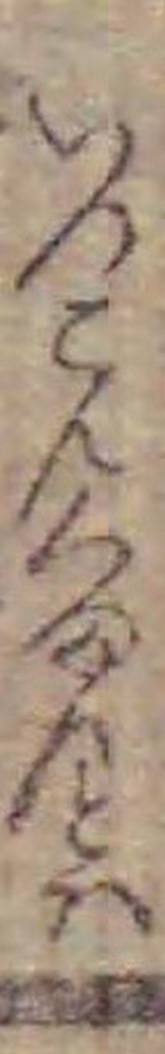いつこんくまんとは
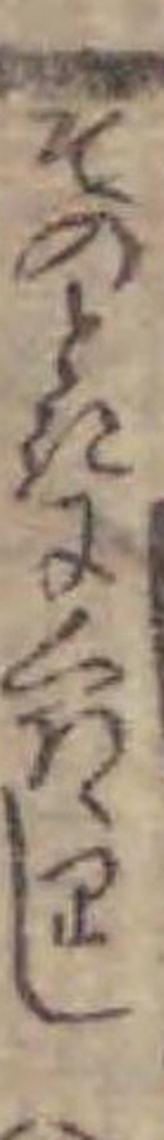そのときにくわゝりし
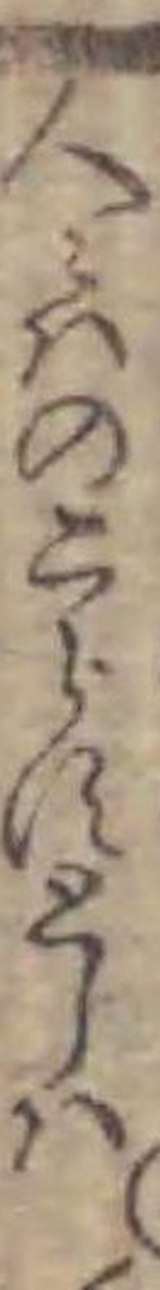人々はのこらすとしは
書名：年寄之冷水曽我 : 3巻
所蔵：国立国会図書館 National Diet Library, JAPAN
